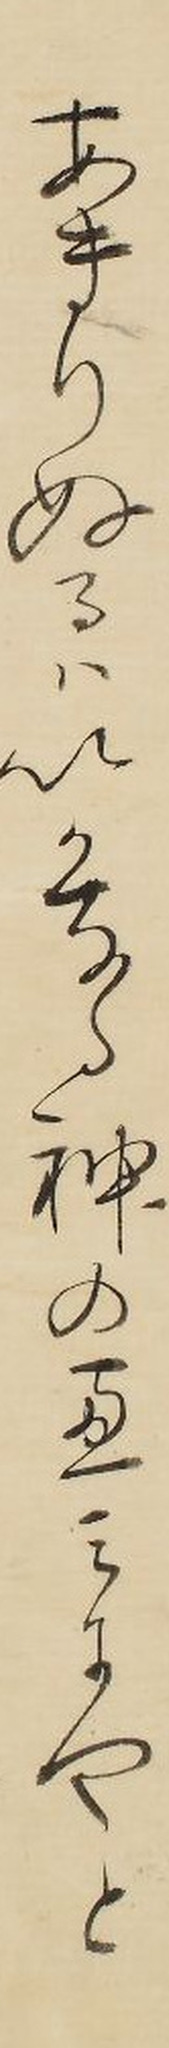あまりぬるはいかなる神の恵みにやと
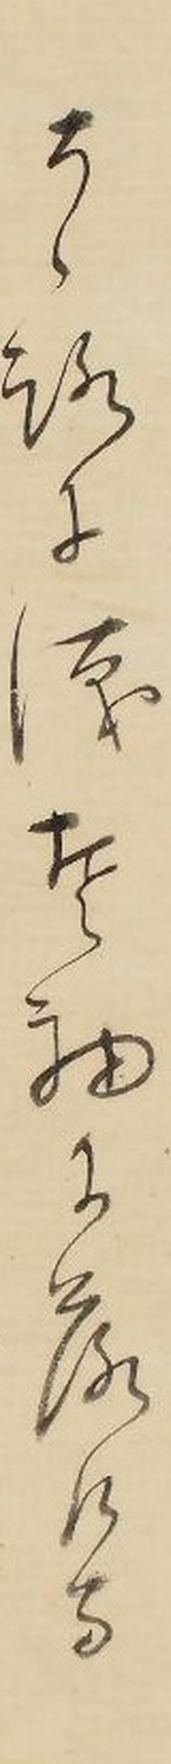そゝろに涙そ袖に落ける
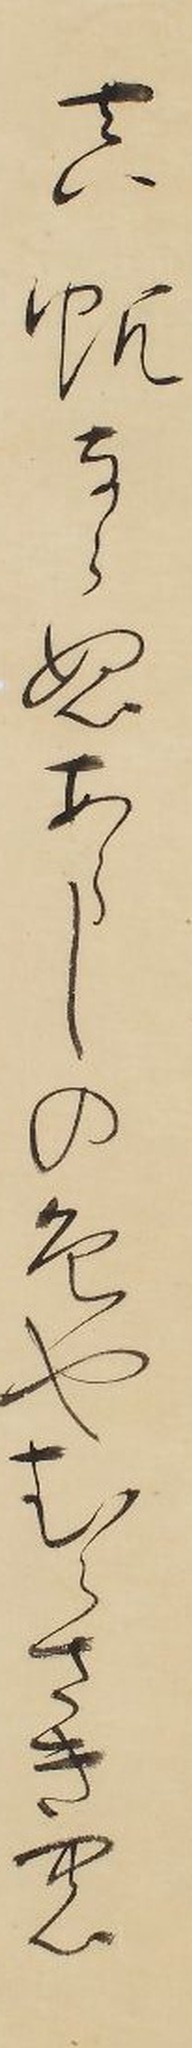真帆ならぬあらしの色やむらさきの
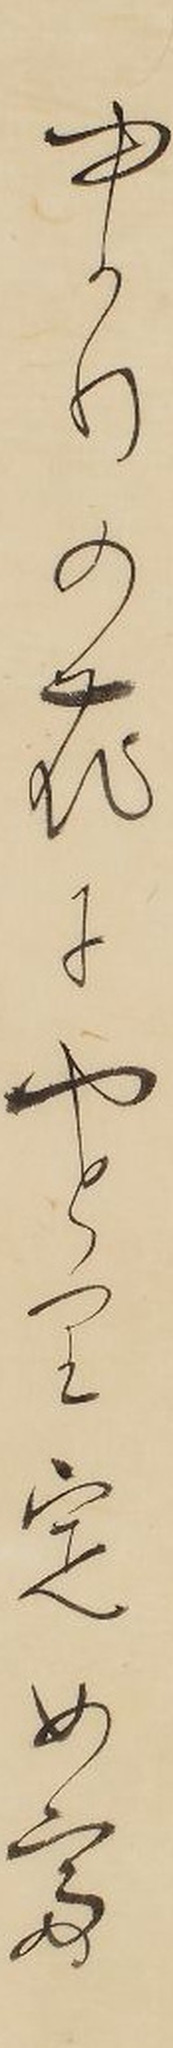ゆかりの花にやとり定めて
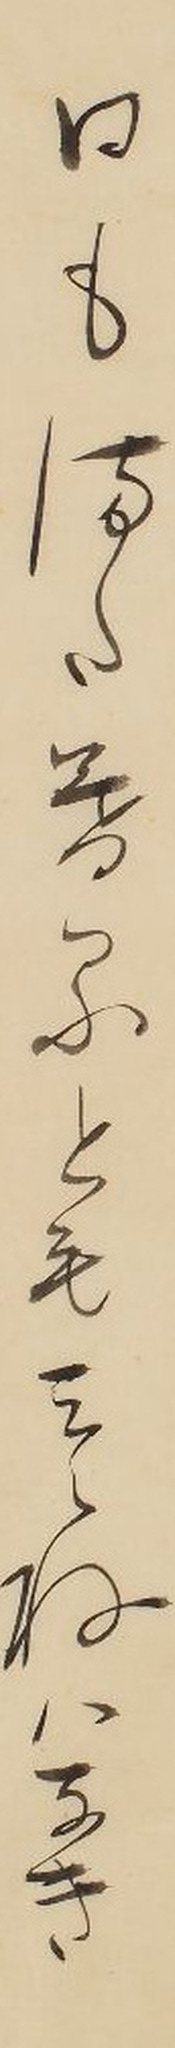日もまた暮るともみえねはなき
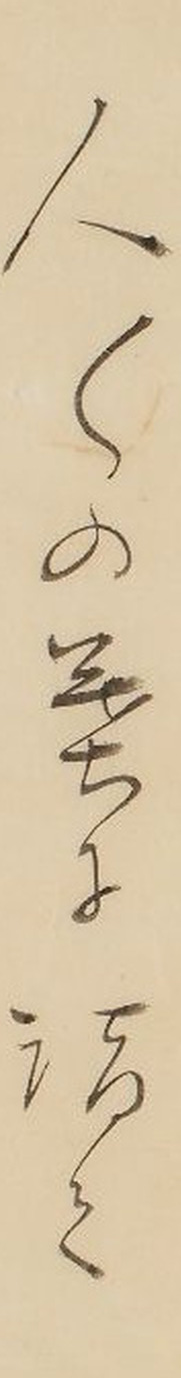ひと〳〵の墓に詣て
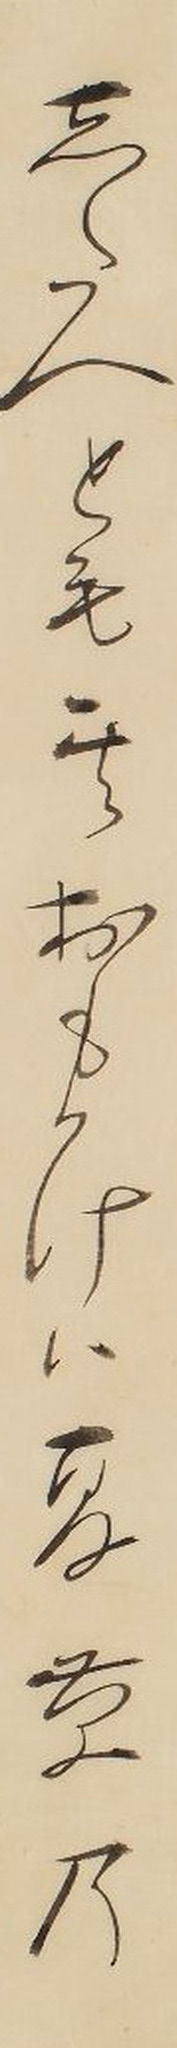したへとも其おもかけは夏草の
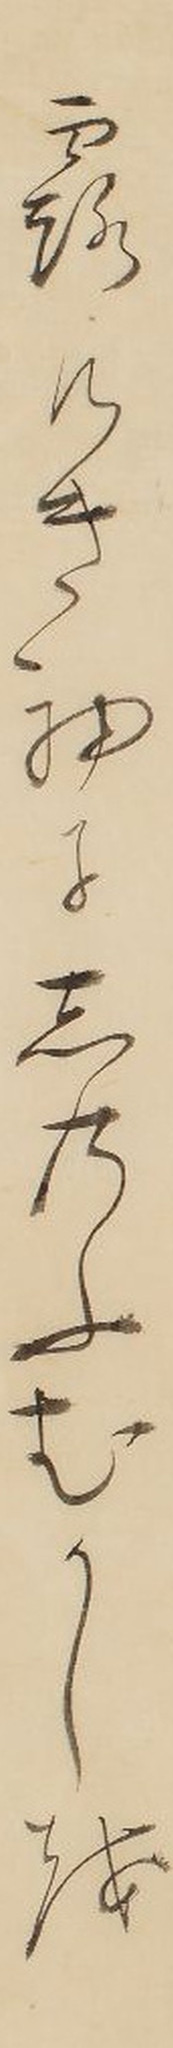露けき袖にしのふむかしを
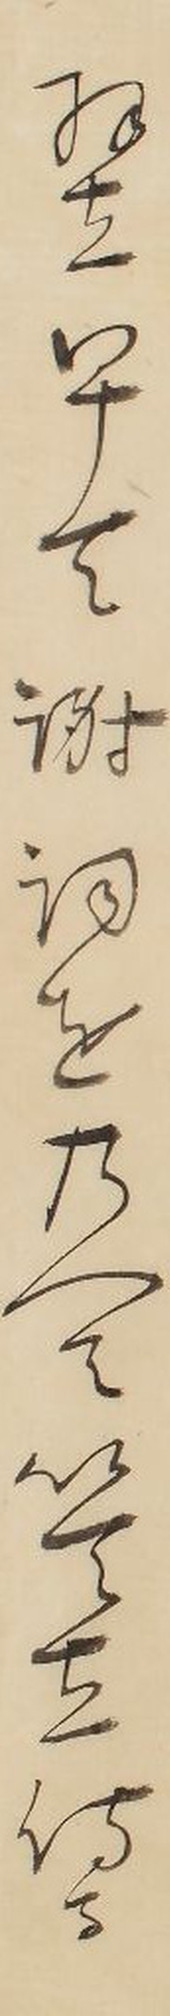翌早天謝詞をのへていて立侍る
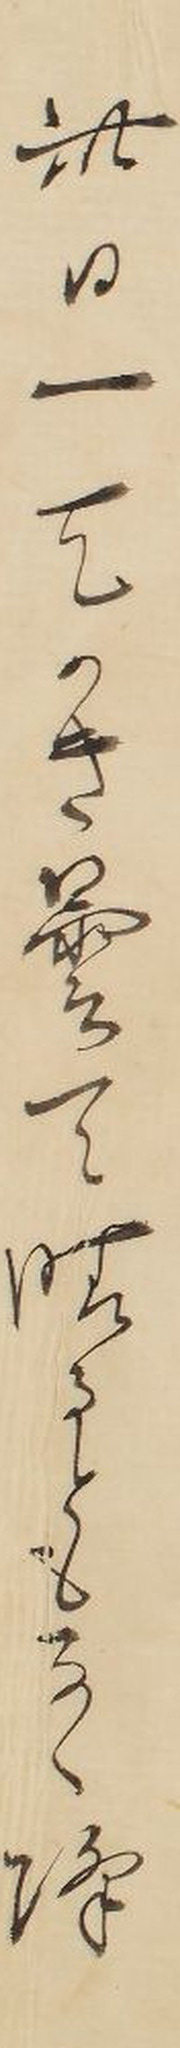此日一天かき雲て晴るともなく降
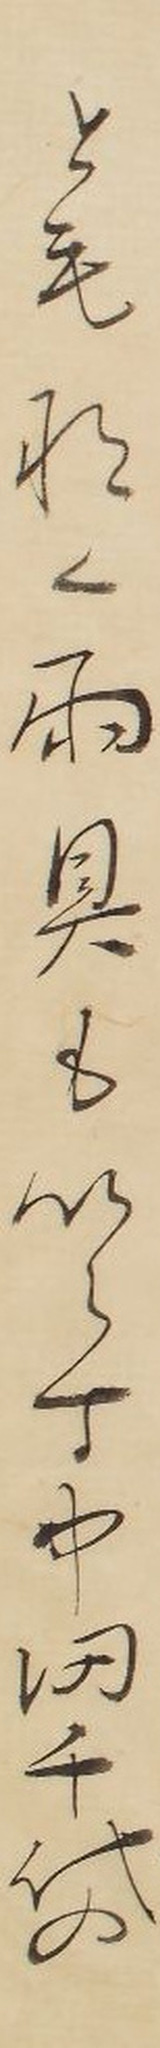ともなく雨具もいらす中田千代の

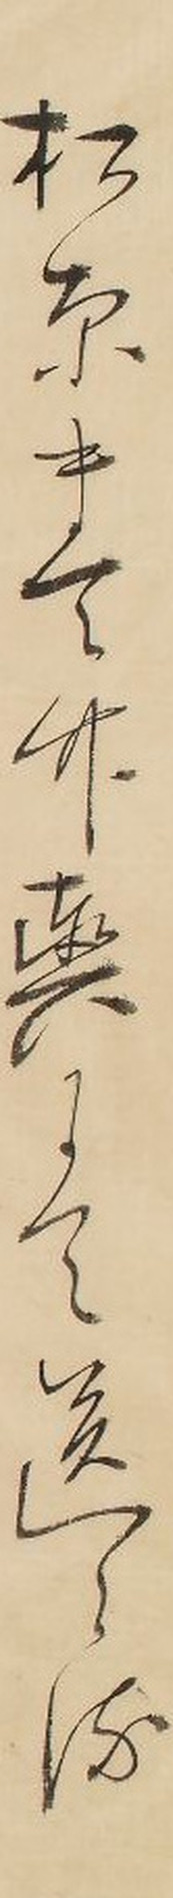松原まて竹輿にて送らる
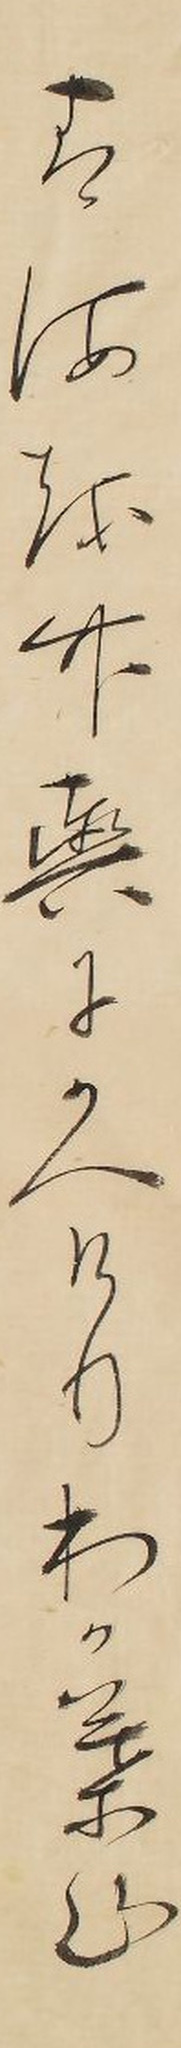青海を竹輿にかへけりわか葉山
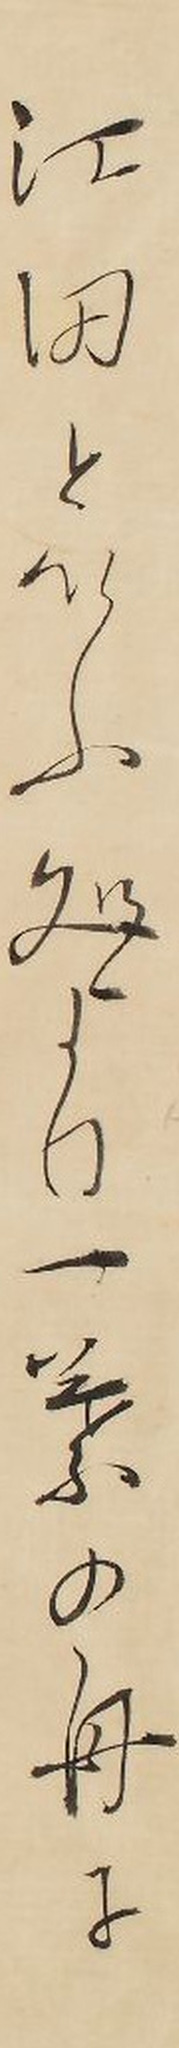江田といふ処より一葉の舟に
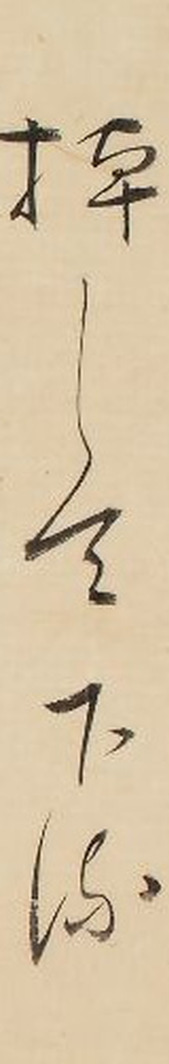棹して下る
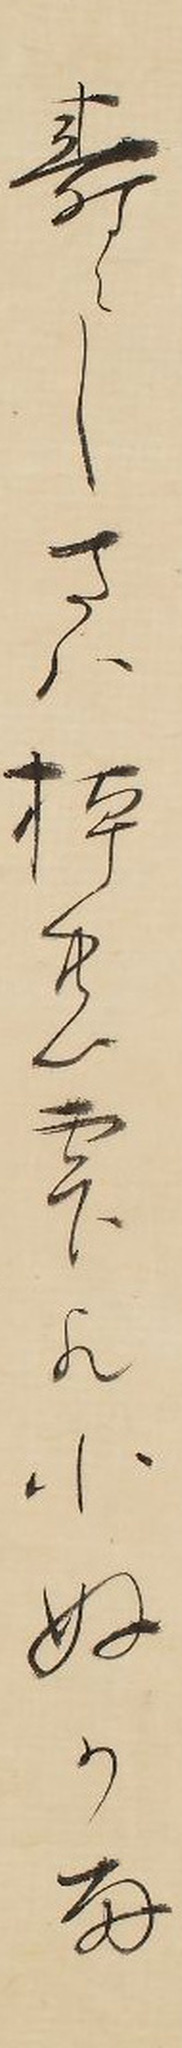すゝしさは棹の雫か小ぬか雨
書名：花土産
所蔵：徳島県立図書館
